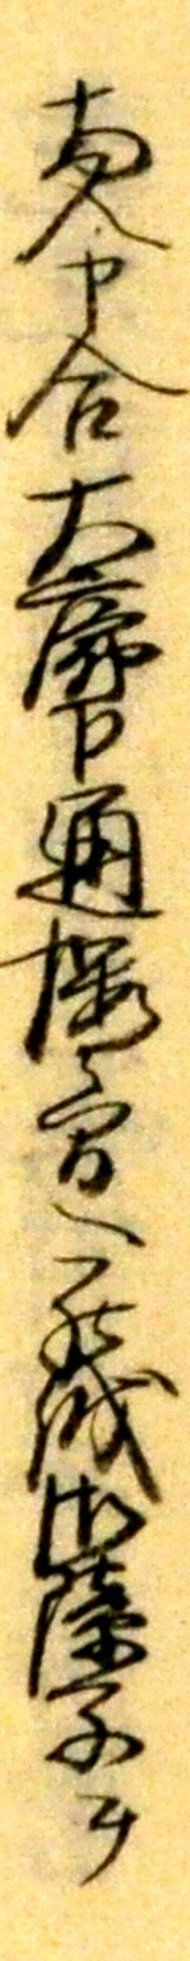両人申合大廊下通桜之間へ罷越御障子ヲ
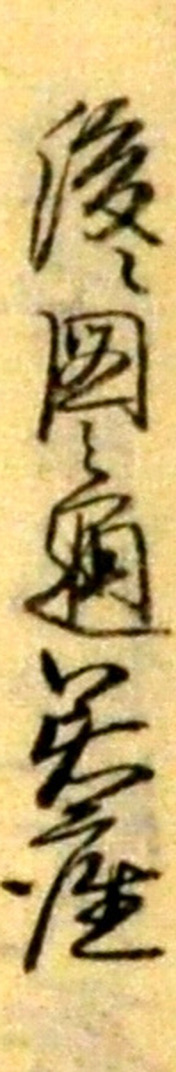後ニ図之通着座
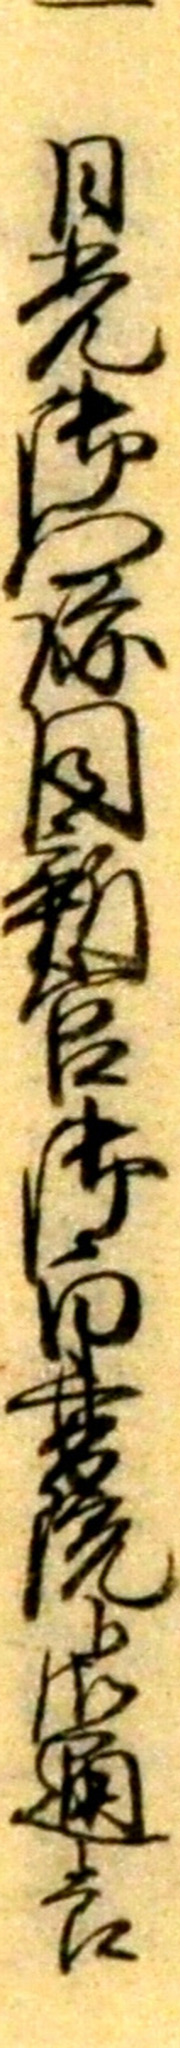一日光御門跡同新官御白書院え御通之節
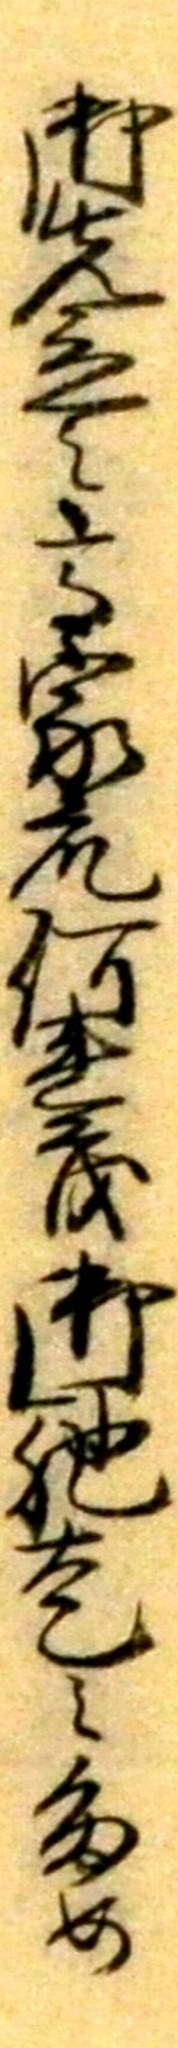御先立は高家衆何れも御馳走之ため
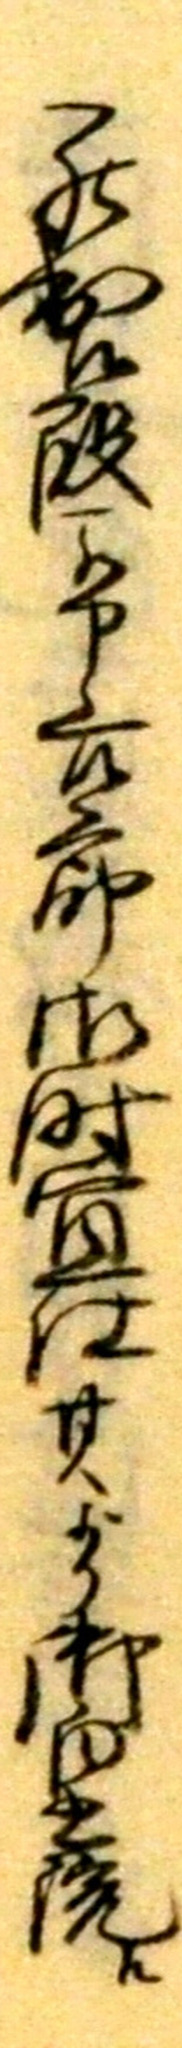罷出候段被申上候節御時宜仕其より御白書院え
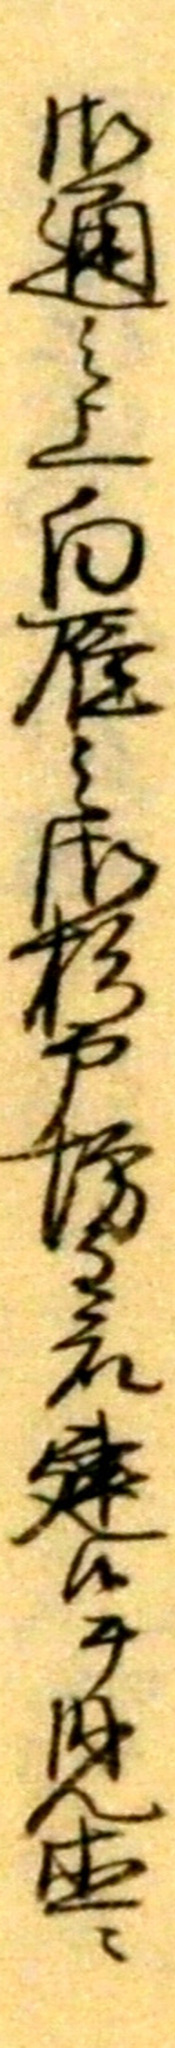御通之上白雁之御杉戸坊主衆建候ヲ見直ニ
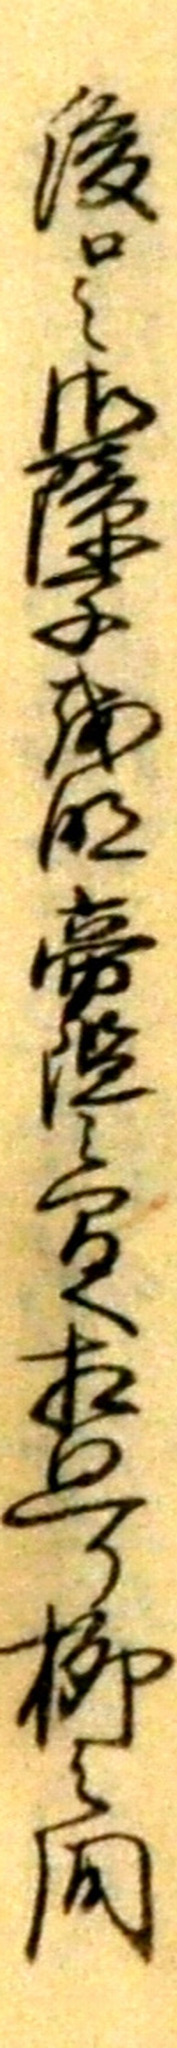後ロ之御障子を明帝鑑之間へ相廻り柳之間

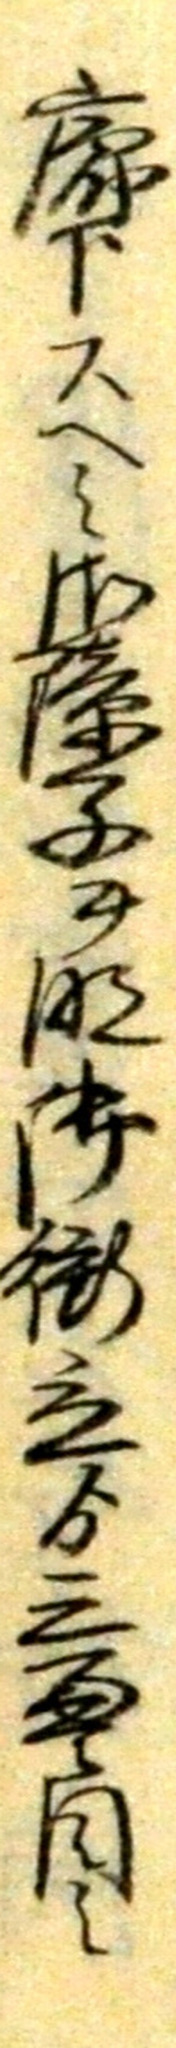廊下スヘ之御障子ヲ明御衝立ゟ三畳目之
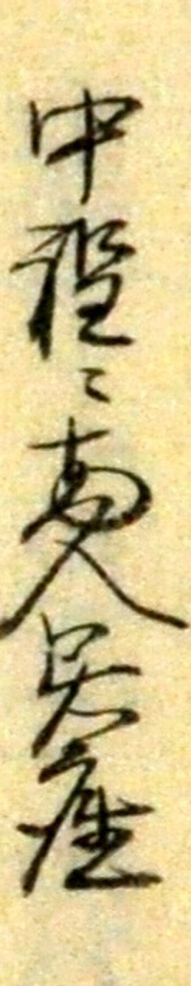中程ニ両人着座
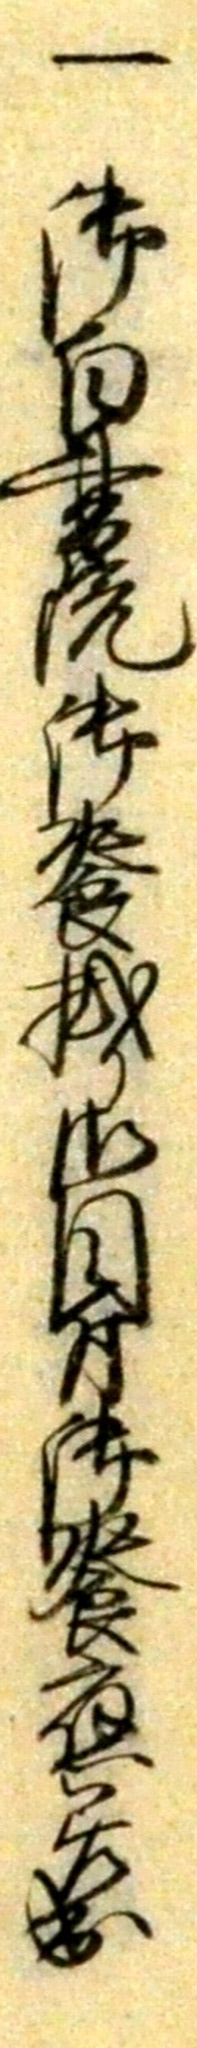一御白書院御饗掛り御目付御饗応差出
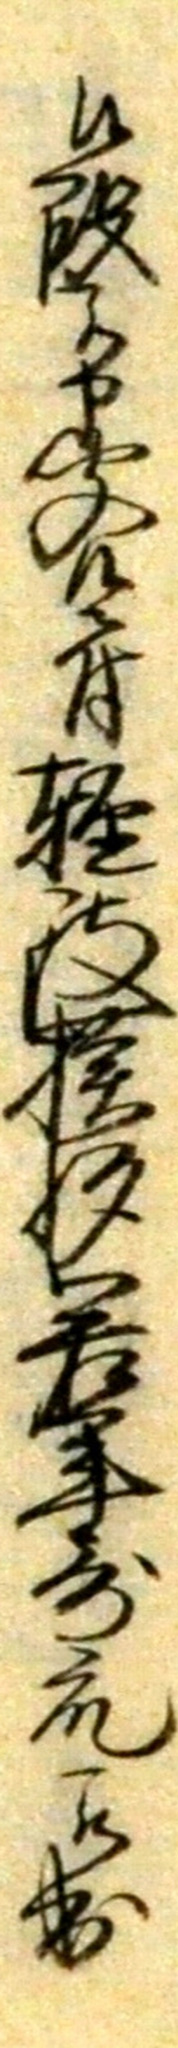候段被申聞候ニ付軽致挨拶若年寄衆被出
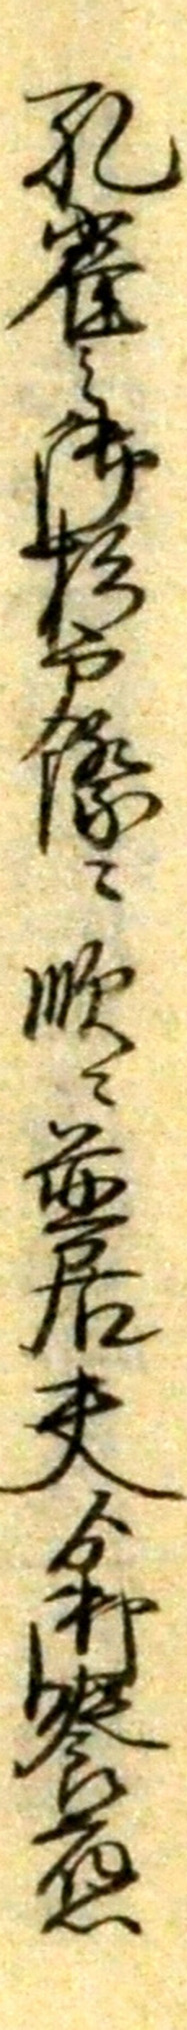孔雀之御杉戸際ニ順ニ並居夫ゟ御饗応
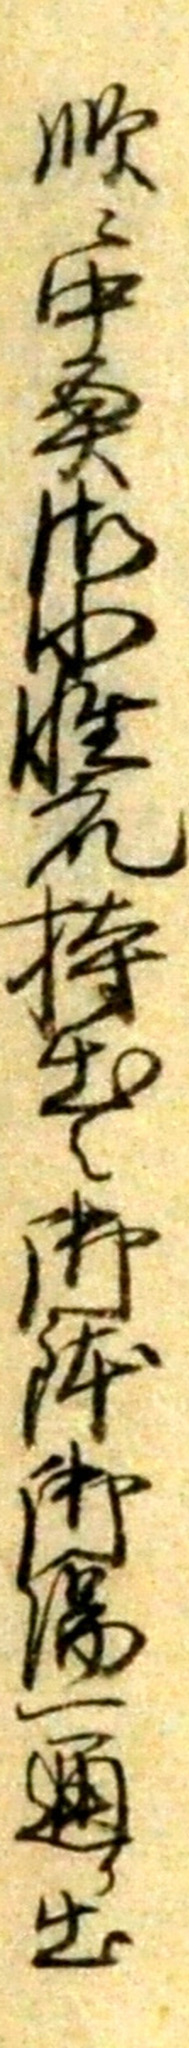順ニ中奥御小性衆持出之御鉢御湯一通り出
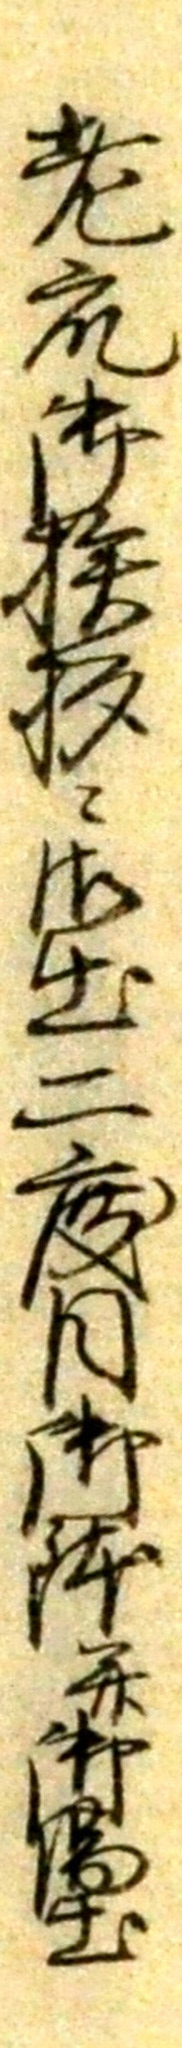老衆御挨拶ニ御出二度目御鉢并御湯出
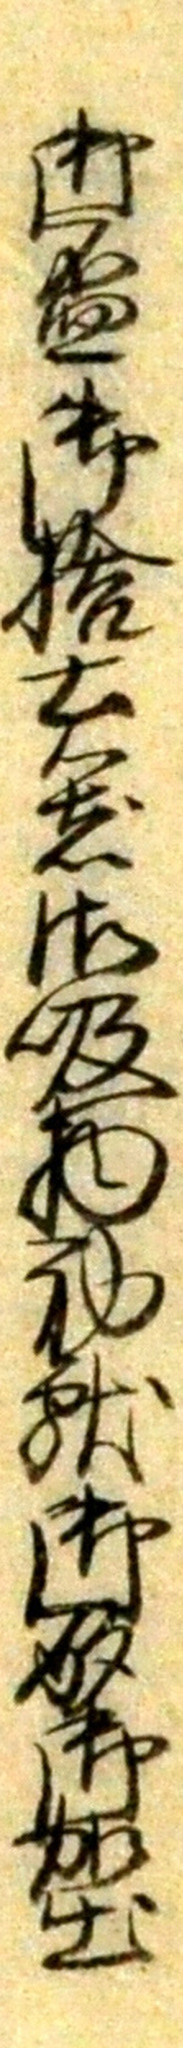御盃御捨土器御吸物初献御酌御加出
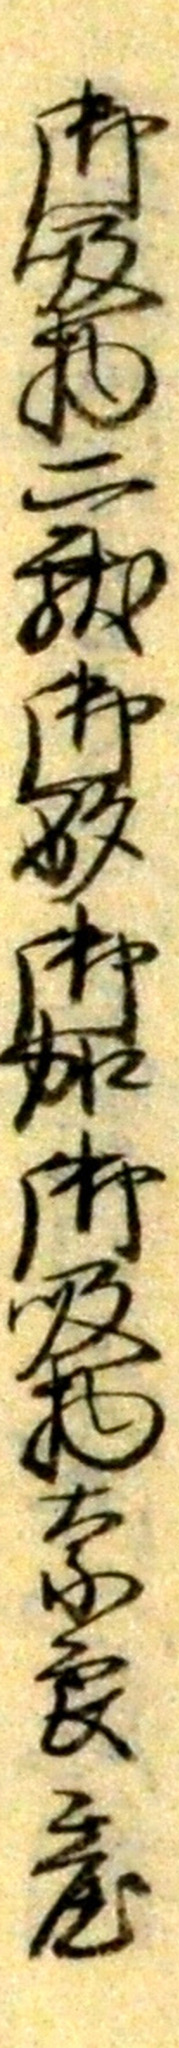御吸物二献御酌御加御吸物奈良台
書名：御移徒相済御祝儀御能ノ節ノ留外
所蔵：伊那市立高遠町図書館・合同会社AMANE
